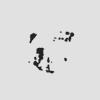屈
